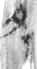丑
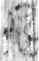是
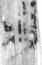胃（謂）
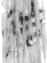結
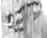日
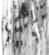{尸拃}（作）
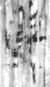事
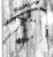不
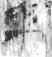果
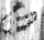㠯（以）
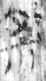祭
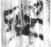○（吝）
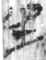生
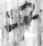子
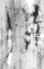無
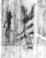俤（弟）
